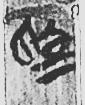爲
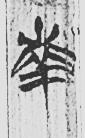南
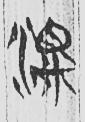{水眔}
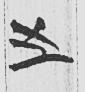之
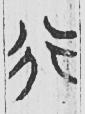行
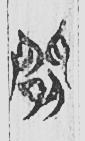{門夕刀}
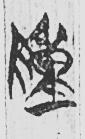陳
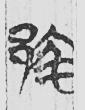○（蔡）
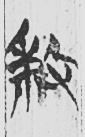殺
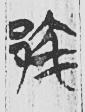○（蔡）
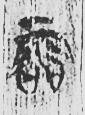霝
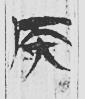侯
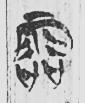霝
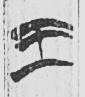王
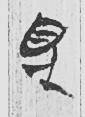見
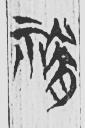禍
